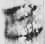己
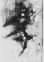丑
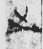之
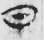日
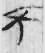不
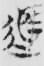𬨭（將）
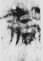○（尚）
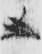之
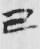己
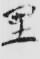里
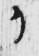人
